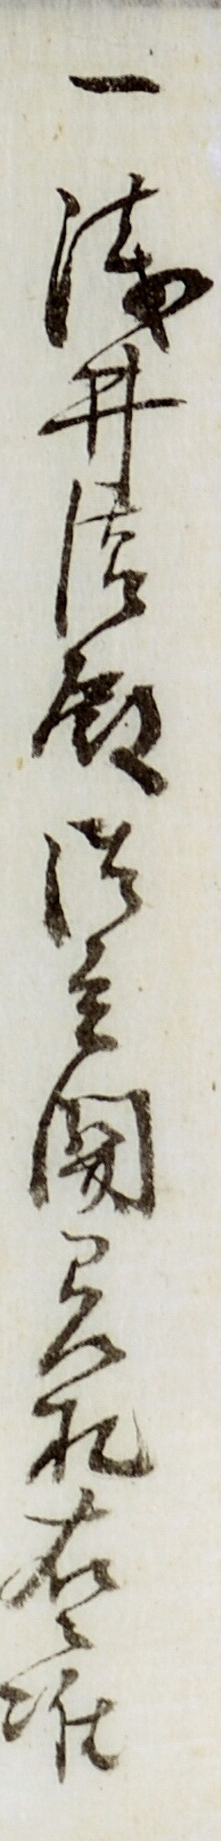一浅井清殿御玄関差札右ニ准
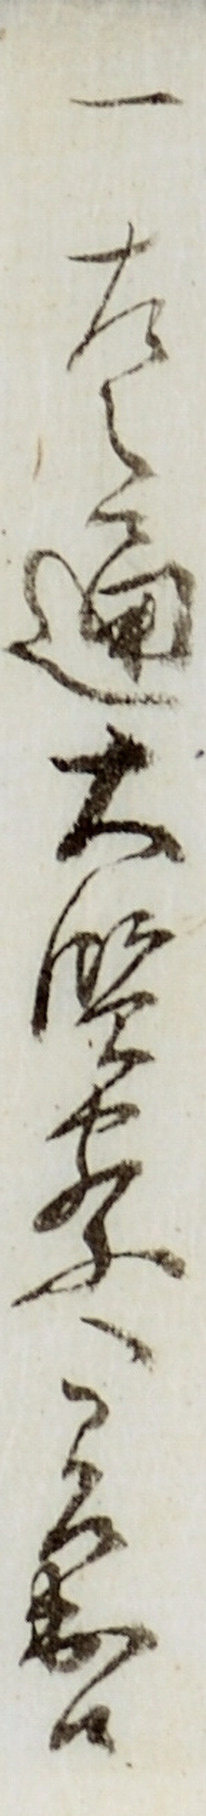一左之通大監察へ差出候
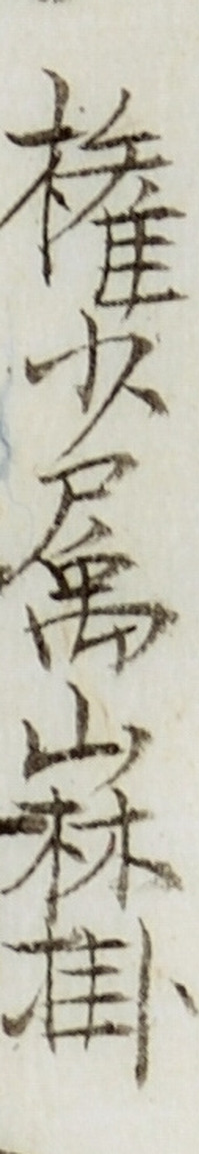権少属山林掛
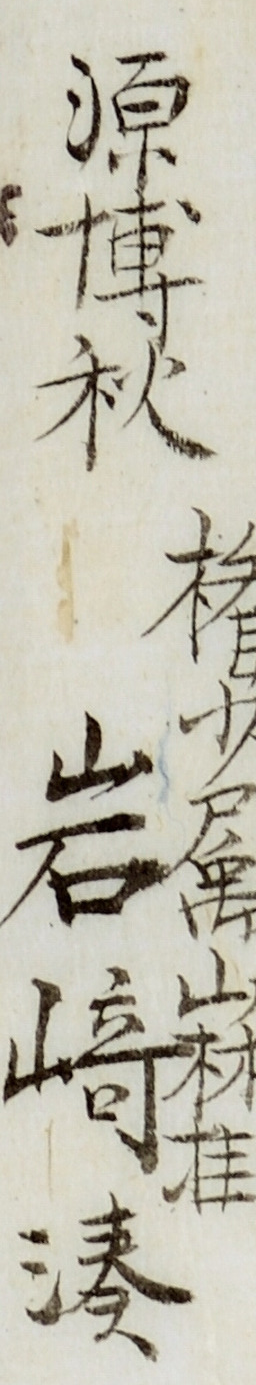源博秋岩崎湊
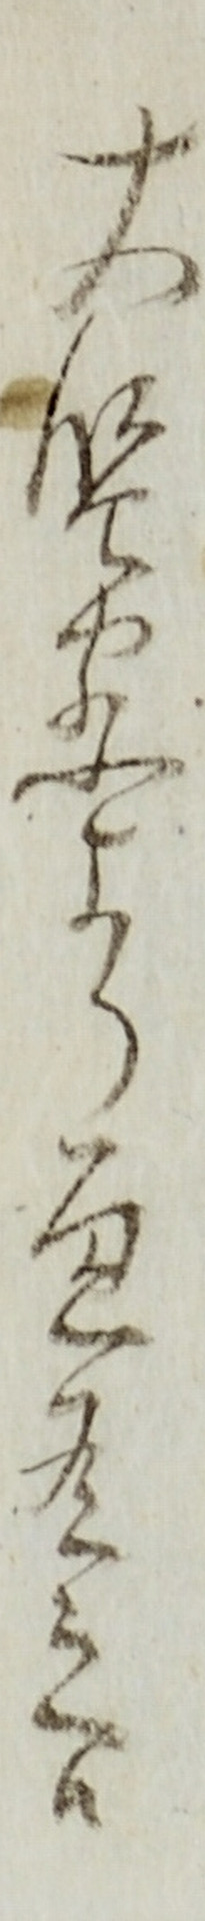大監察より通有之候
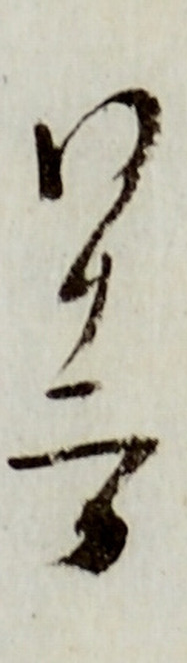同月二日
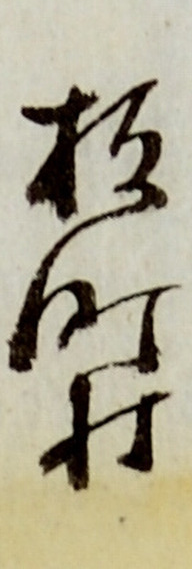板町村
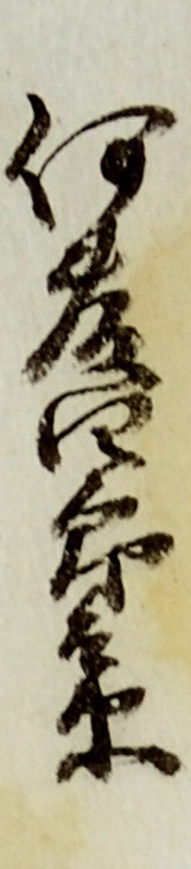伊藤四郎兵衛
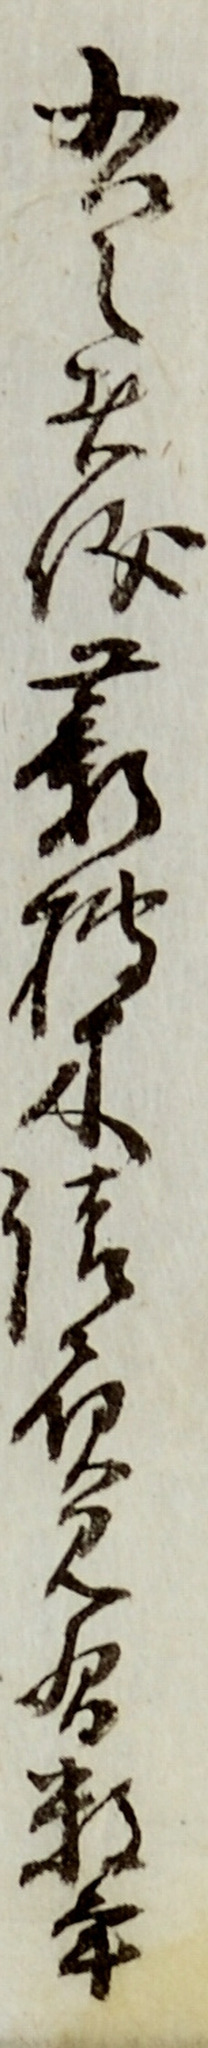右之者儀薪榑木請負見習数年
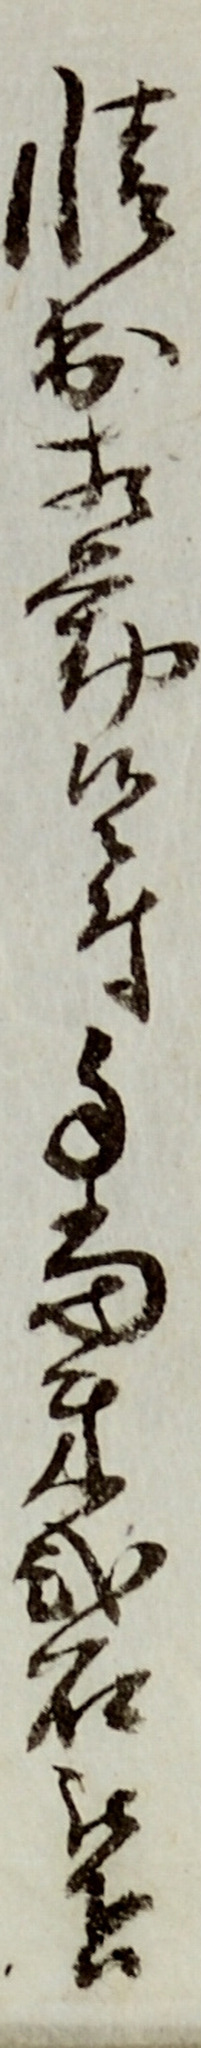情出相勤候ニ付手当米弐石被下候
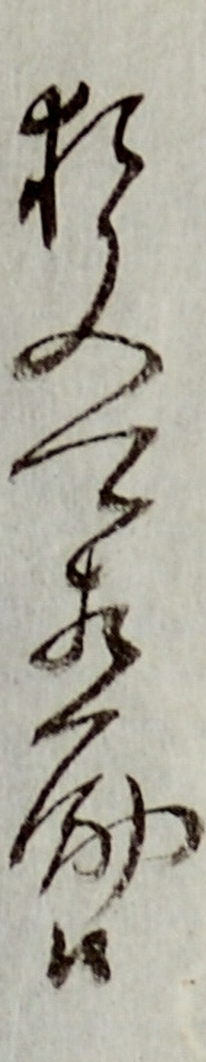猶又可相励候
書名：山林掛御用日記稿
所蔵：伊那市立高遠町図書館・合同会社AMANE
